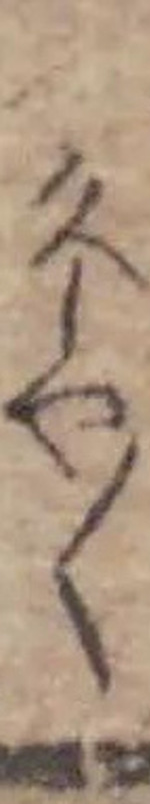久しや〳〵
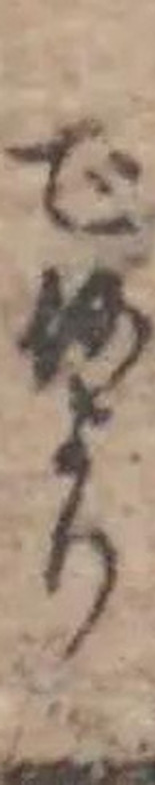で何より
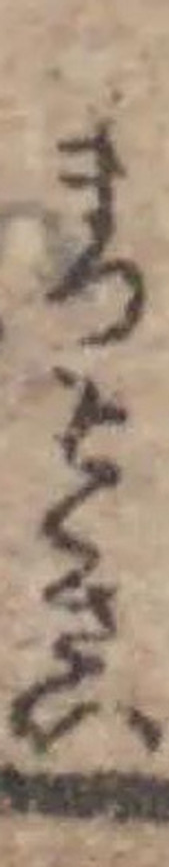まつそくさい
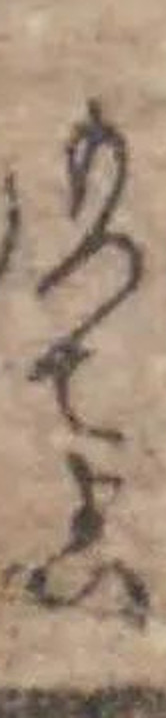もつてよい
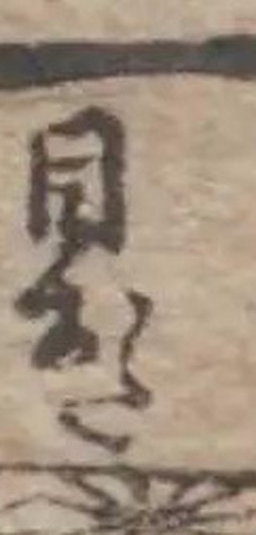目出た

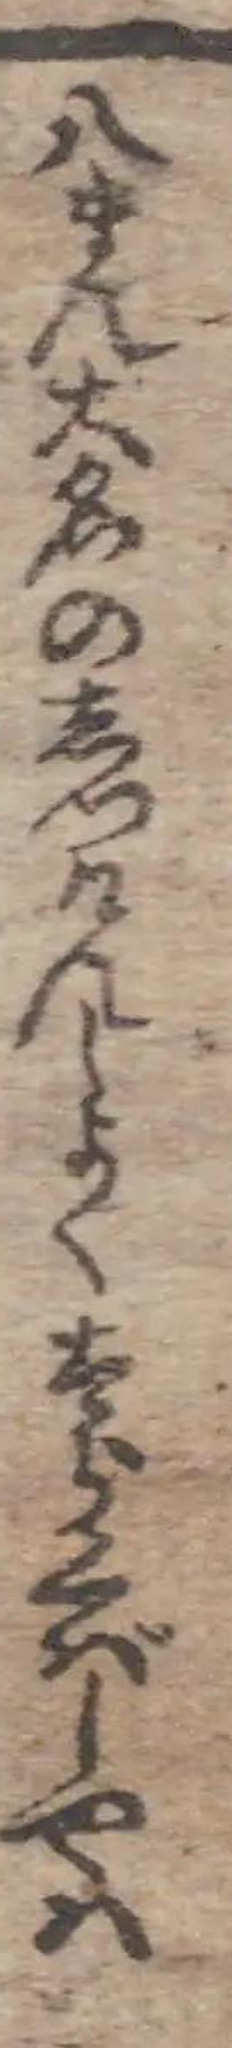八まん大名のしつけんしよく太郎くバしやハ
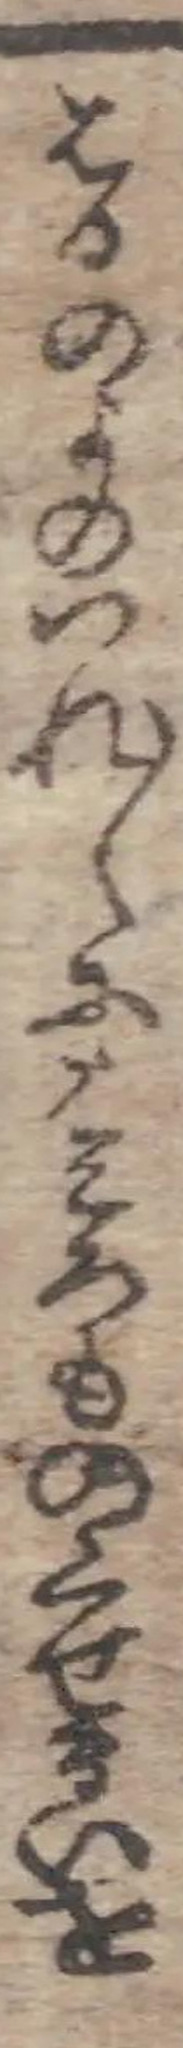はるのよのつれ〳〵にはころものくせまいを
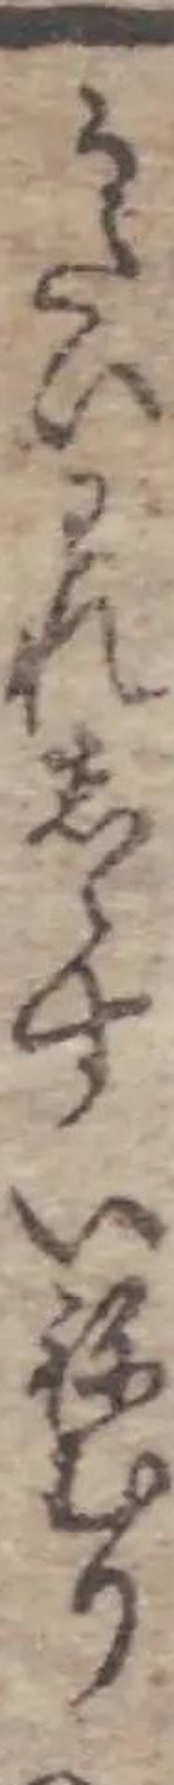うたいわれしらすいねむり
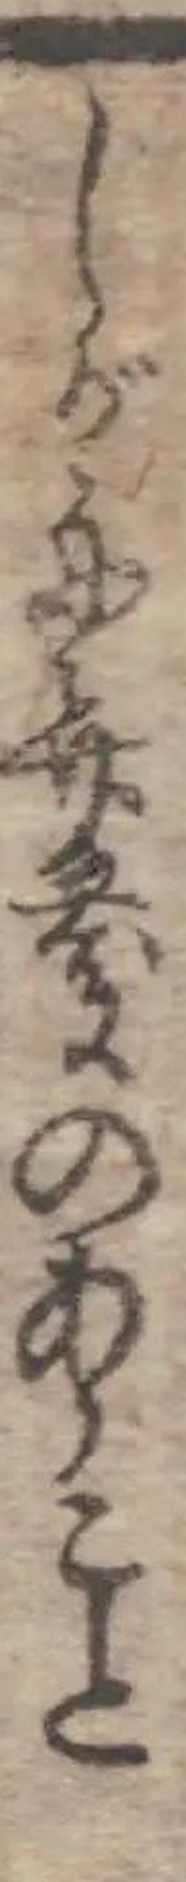しが舟弁慶のありこと
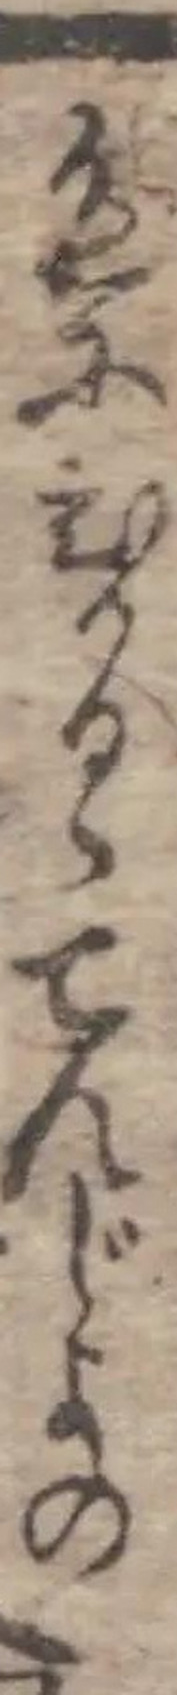色にひかるゝてんじよの
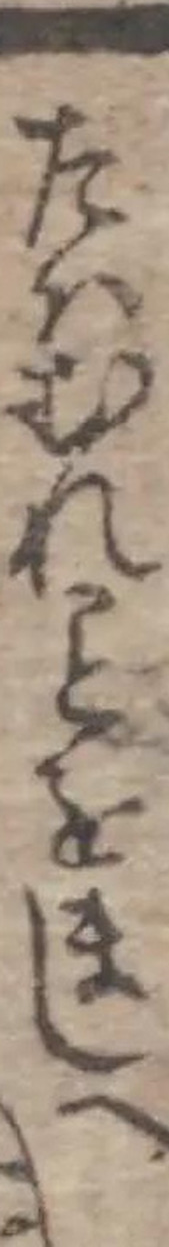たハむれことをましへ
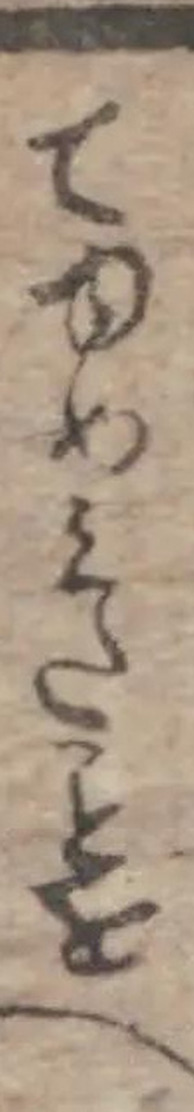てゆめミたことを
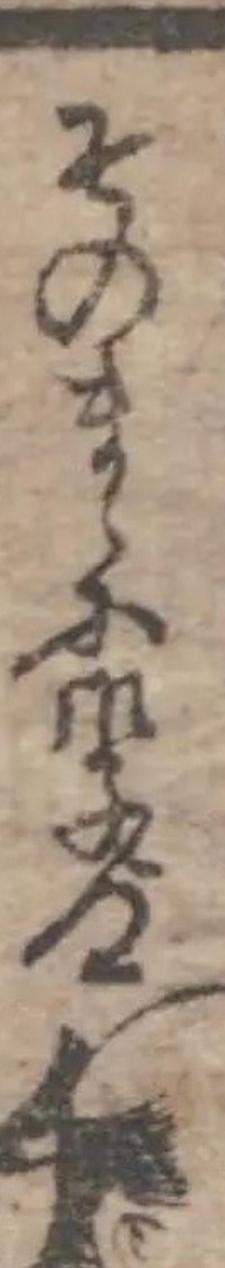そのまゝに御子さま
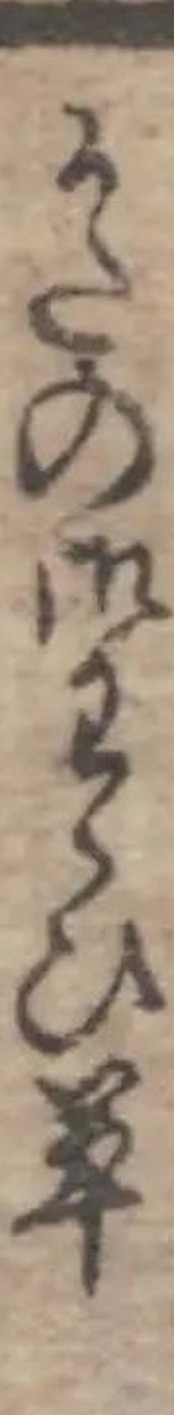かたの御わらひ草
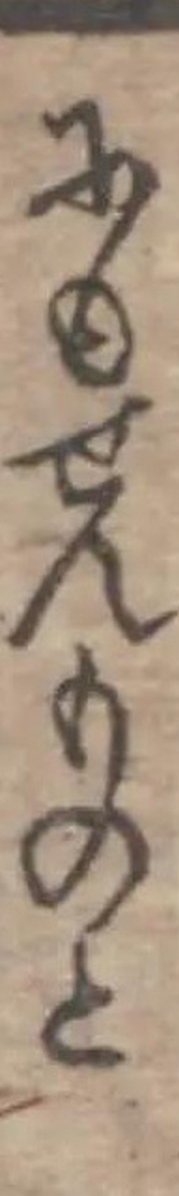にもせんものと
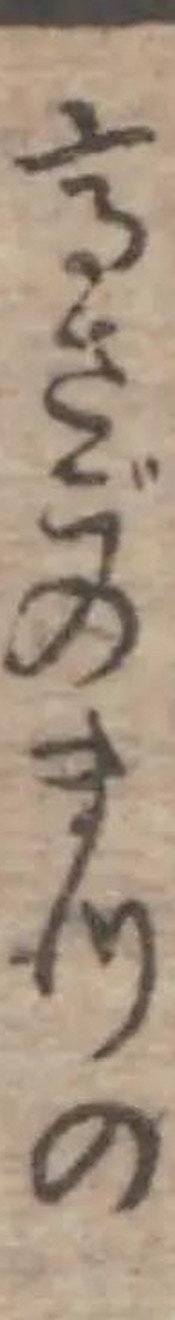高さごのまつの
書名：草紙の曙 3巻
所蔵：国立国会図書館 National Diet Library, JAPAN
